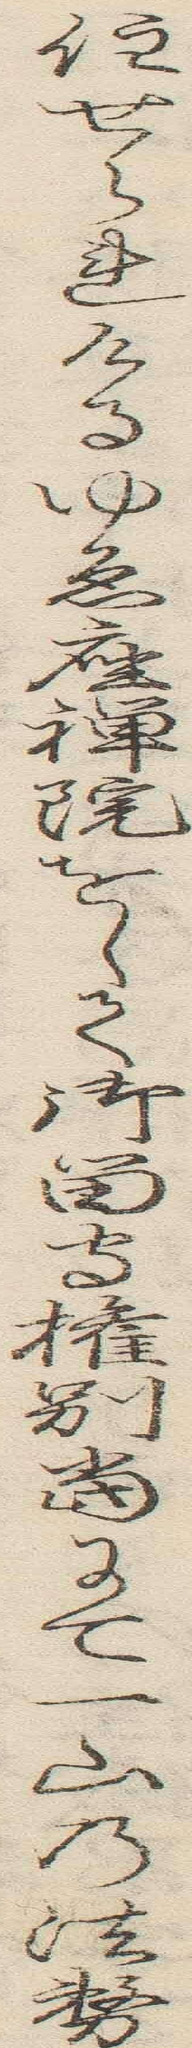住せられけるゆゑ座禅院をして御留守権別當にて一山の法務
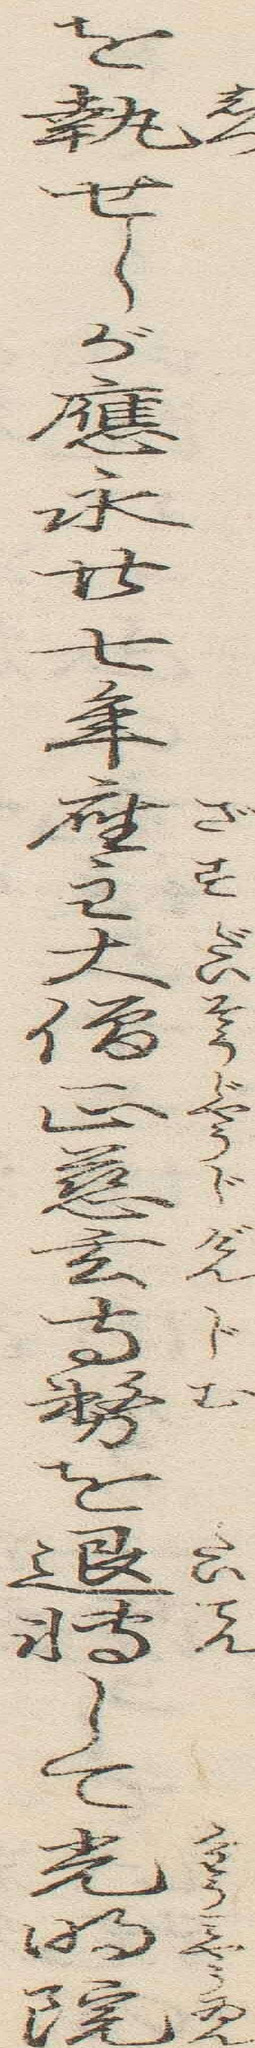を執せしが應永廿七年座主大僧正慈玄寺務を退轉して光明院
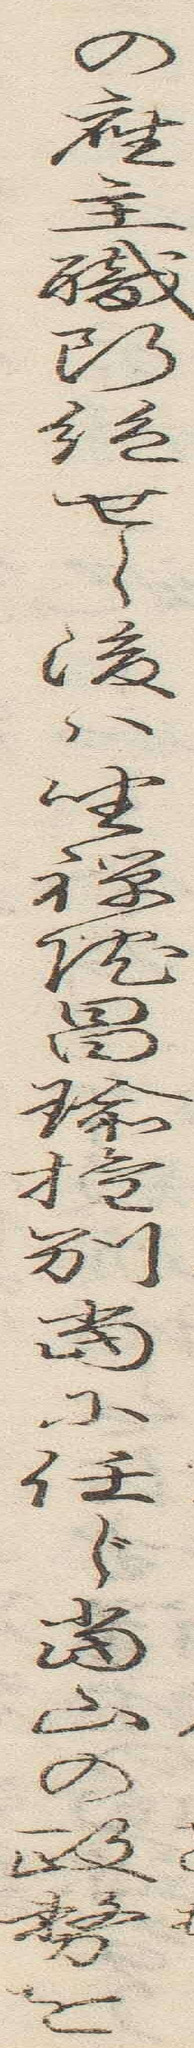の座主職断絶せし後は坐禅院昌瑜権別當に任じ當山の政務を
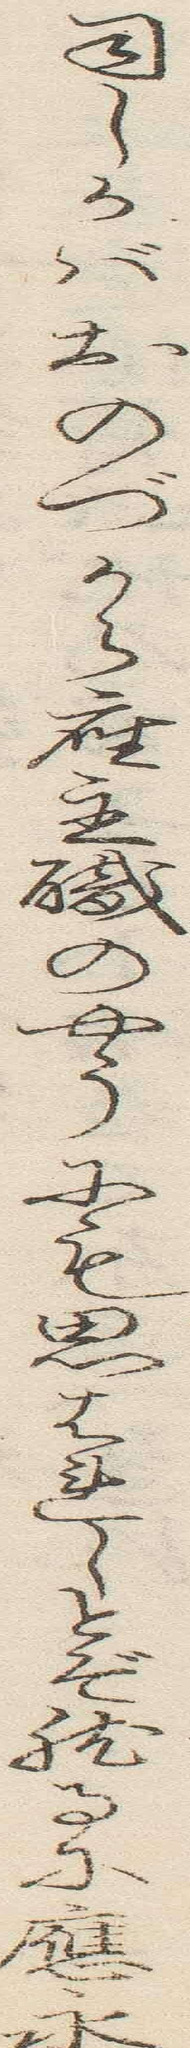司しかばおのづから座主職のやうにも思はれしとぞ然るに應永
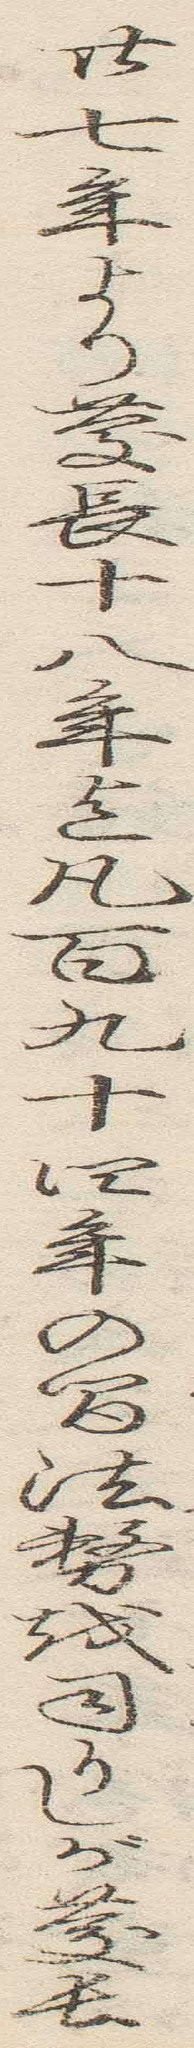廿七年より慶長十八年迄凡百九十四年の間法務を司りしが慶長
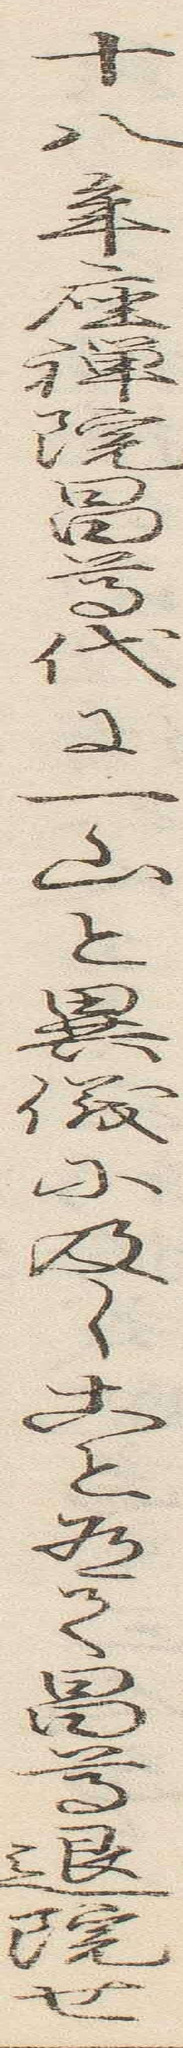十八年座禅院昌尊代に一山と異儀に及しこと有て昌尊退院せ
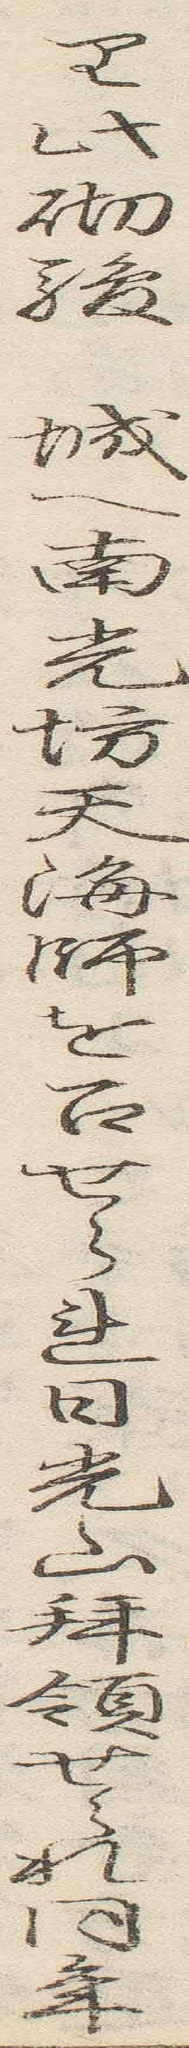り此砌駿城へ南光坊天海師を召せられ日光山拜領せられ同年
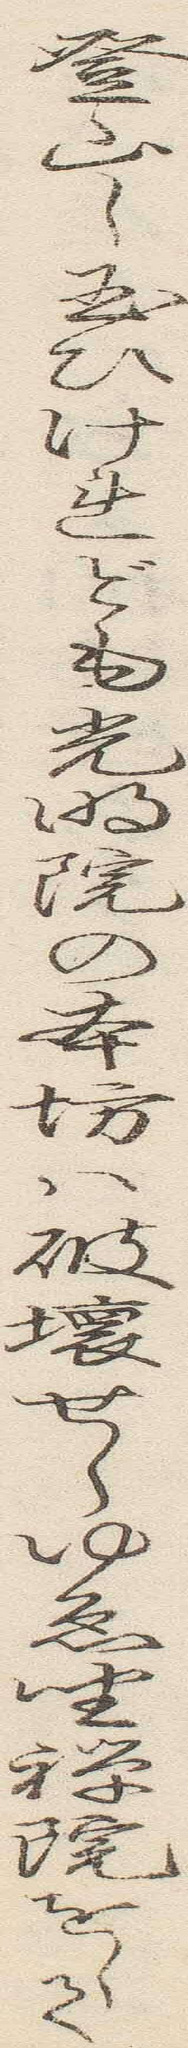登山し玉ひけれども光明院の本坊は破壊せしゆゑ坐禅院をして
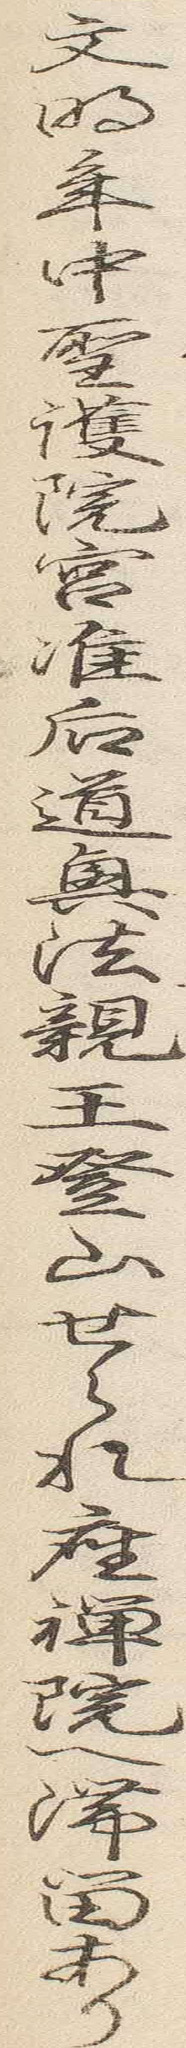文明年中聖護院宮准后道興法親王登山せられ座禅院へ滞畄あり
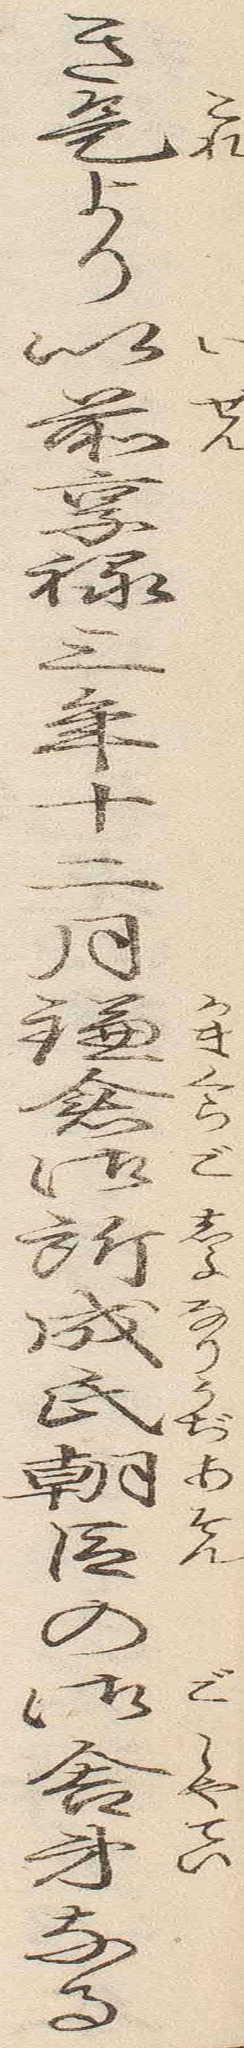き是より以前享禄三年十二月鎌倉御所成氏朝臣の御舎㐧なる
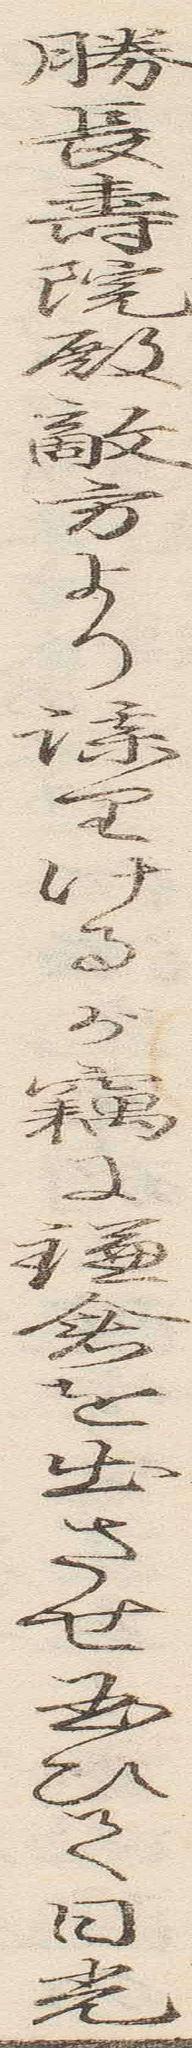勝長壽院殿敵方より謀りけるが竊に鎌倉を出させ玉ひて日光
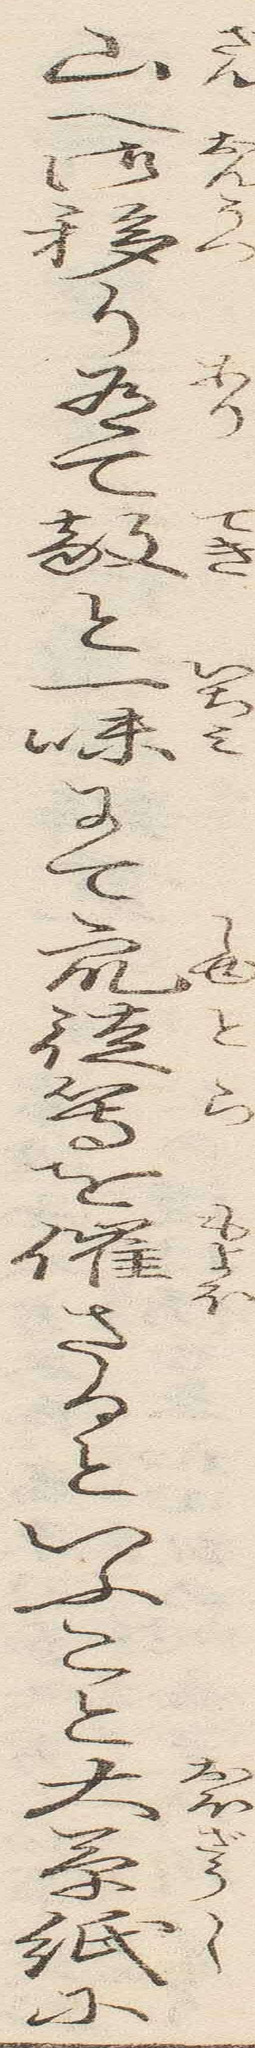山へ御移り有て敵と一味にて衆徒等を催さるといふこと大草紙に
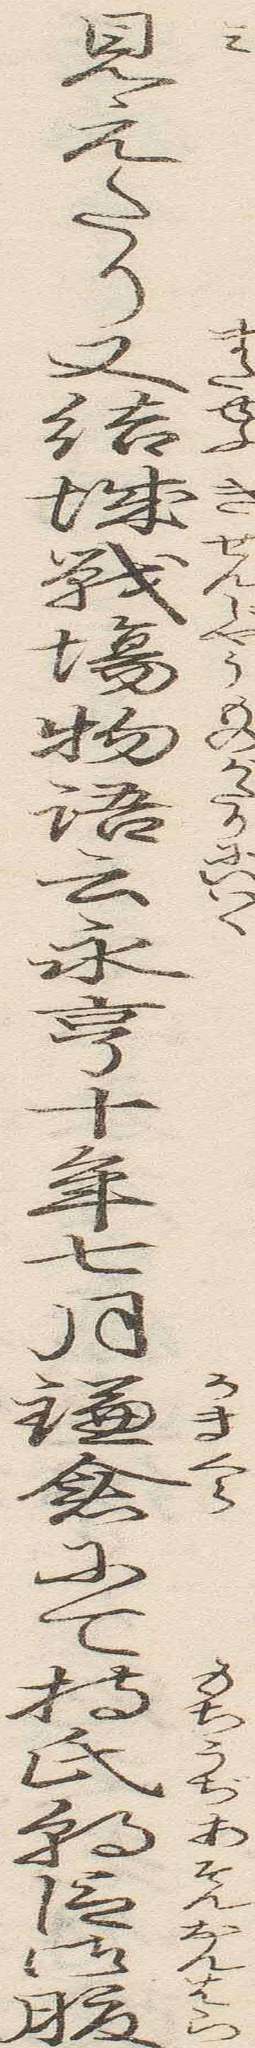見えたり又結城戦塲物語云永亨十年七月鎌倉にて持氏朝臣御腹
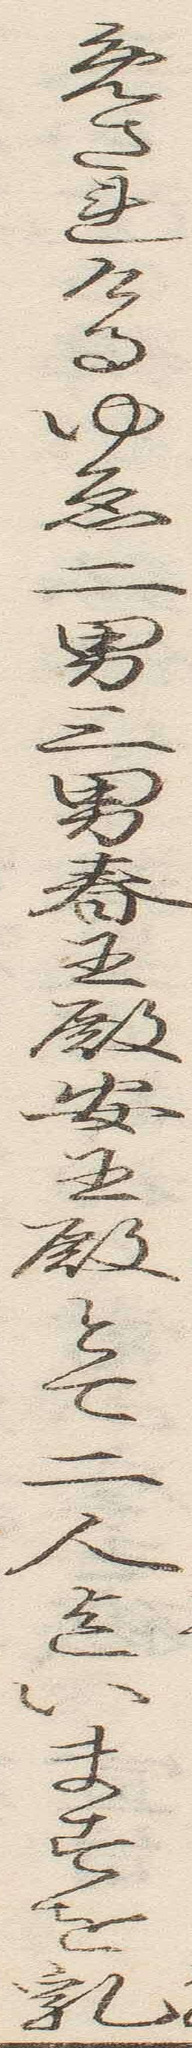めされけるゆゑ二男三男春王殿安王殿とて二人迄いますを乳
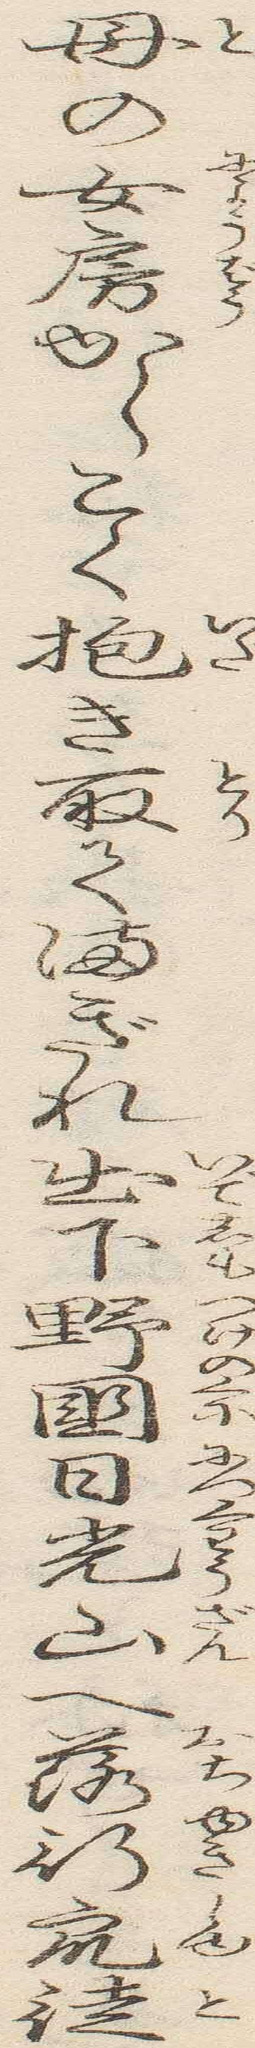母の女房かしこく抱き取てまぎれ出下野國日光山へ落行衆徒
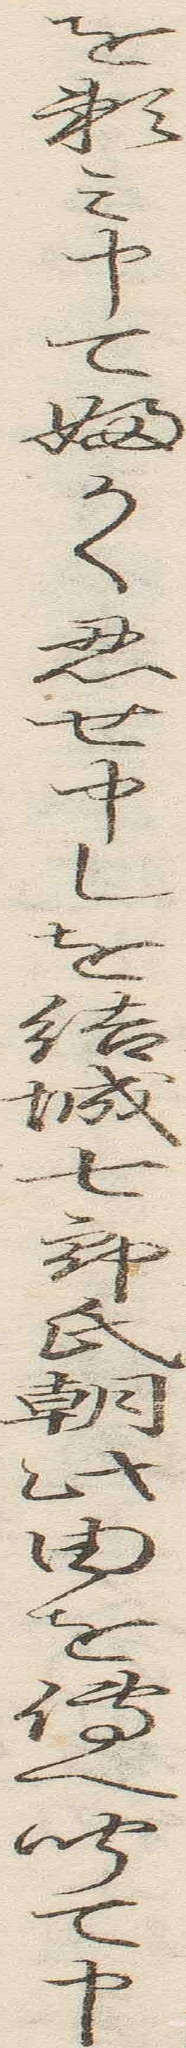を頼み申てふかく忍せ申しを結城七郎氏朝此由を傳へ聞て申
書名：日光山志
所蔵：東京学芸大学附属図書館 国文学研究資料館
